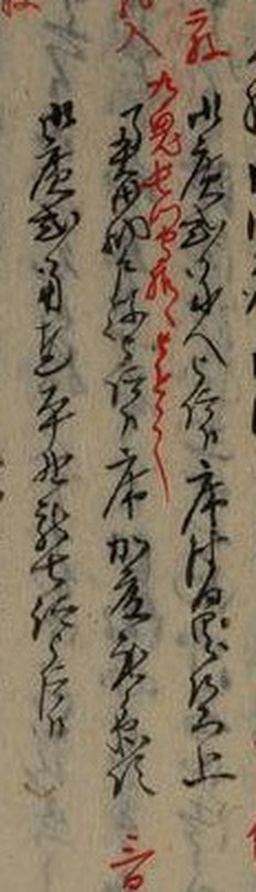奥御納戸役被仰付席加藤庄兵衛跡
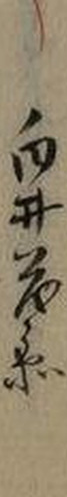白井茂兵衛
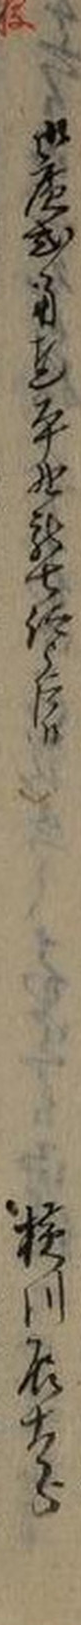御広敷御用達平野新七跡被仰付横川辰太郎
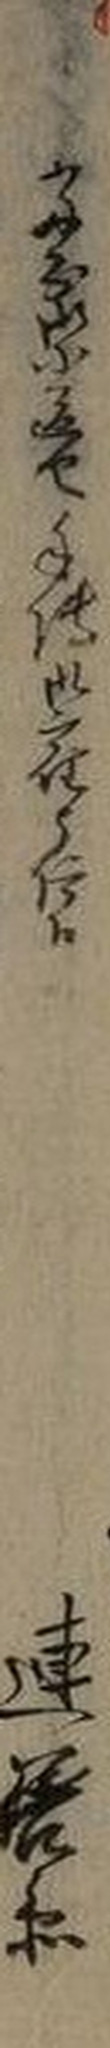当分御小道具手伝御雇被仰付連善兵衛
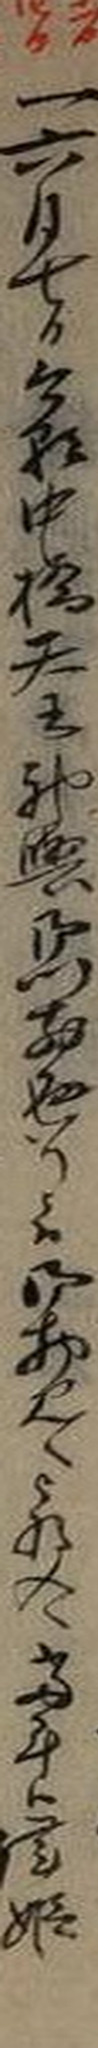一六月七日今朝中橋天王神輿御門前通り候付御物見へ被為入候当年ハ謹姫
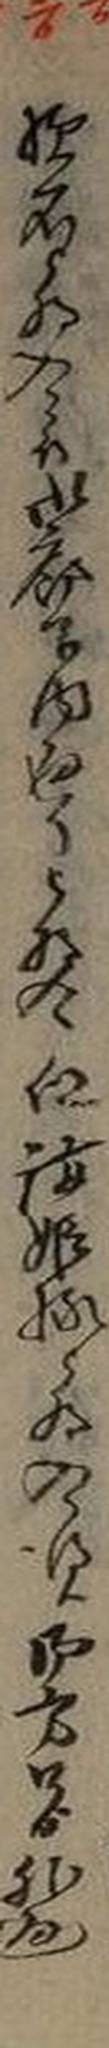様不入候ニ付御廊下内通り被為入候但謹姫様被為入候得ハ御方口ゟ外通
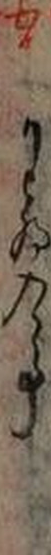り被為入候事
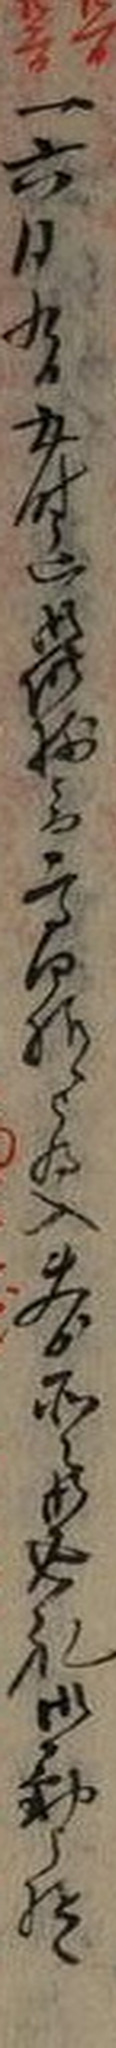一六月九日五時過御供揃ニ而高田様へ被為入夫ゟ所々御返礼御勤被遊候
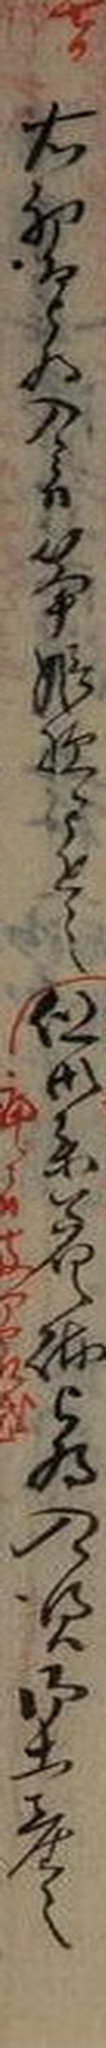右初而被為入候ニ付箏姫様へ被進之但御参着之砌被為入候得ハ御土産之
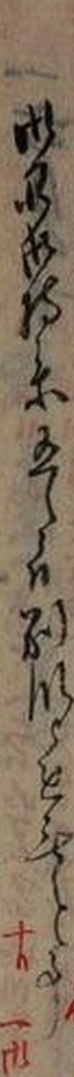御品御持参有之候ニ付別段被進無之候事
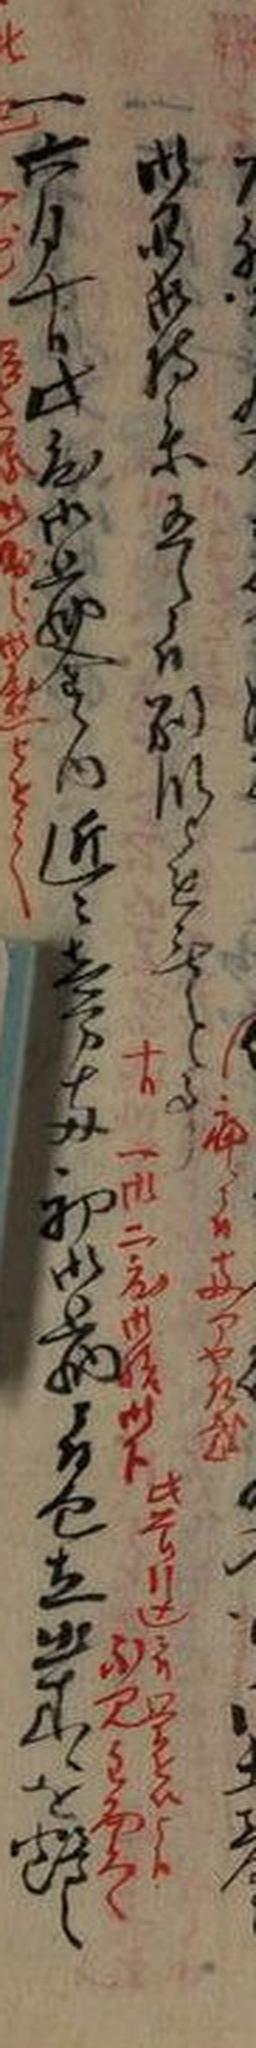一六月十日此度御上納金之内近々壱万両初御上納ニ付包立出来候を鶴之

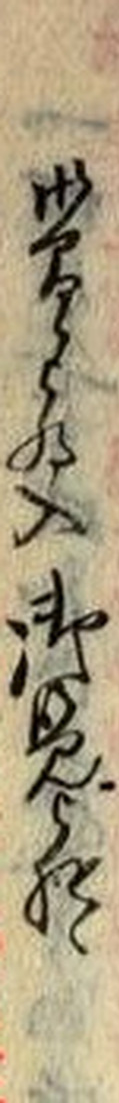御間へ被為入御覧被遊候
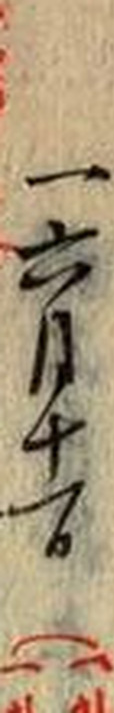一六月十一日
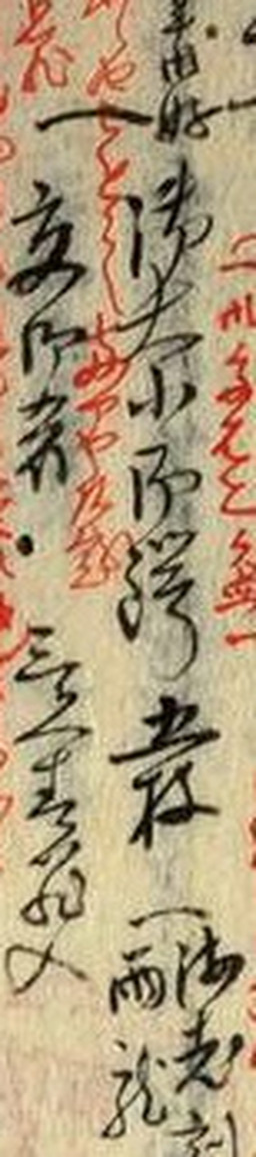交御肴三尺青籠入
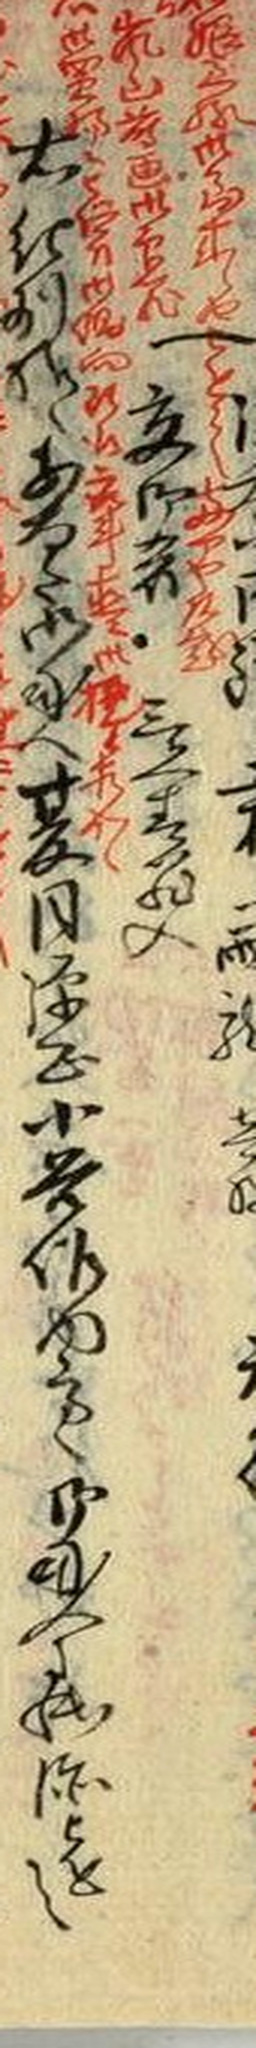右紀州様へあなた御用人夏目弾正小谷作内方へ御用人手紙添被進之
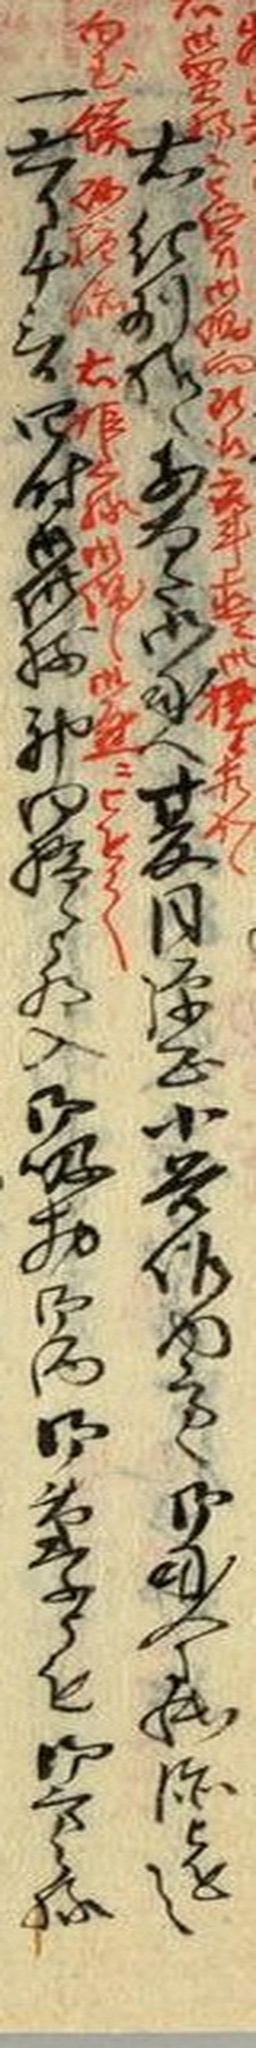一六月十三日四時御供揃神田橋へ被為入御吸物御酒御菓子被進御方々様
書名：少傅日録抄（斉承付側向頭取日記、在府）
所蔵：福井県文書館 Fukui Prefectural Archives
